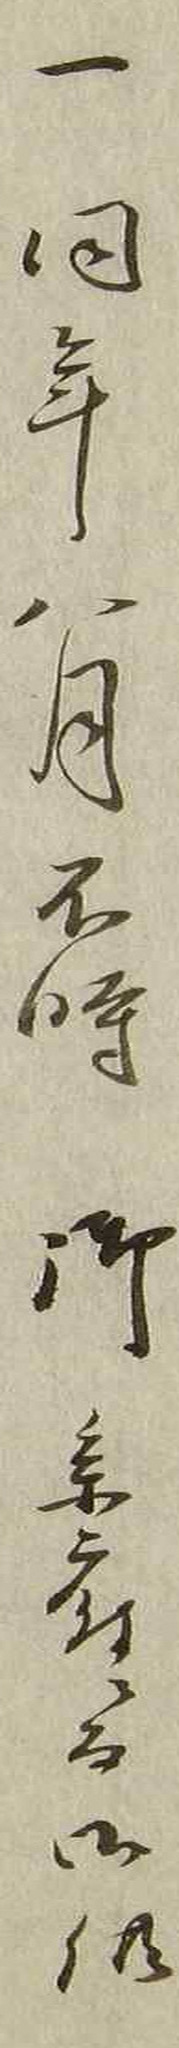一同年八月不時御参府ニ而御供
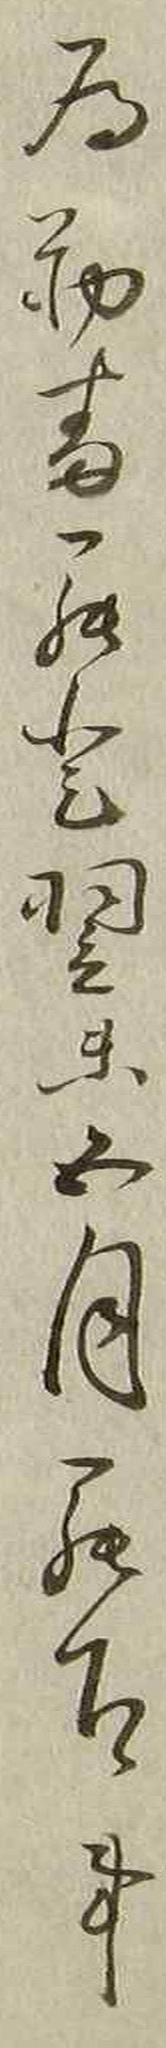為勤番罷登翌未五月罷下候事
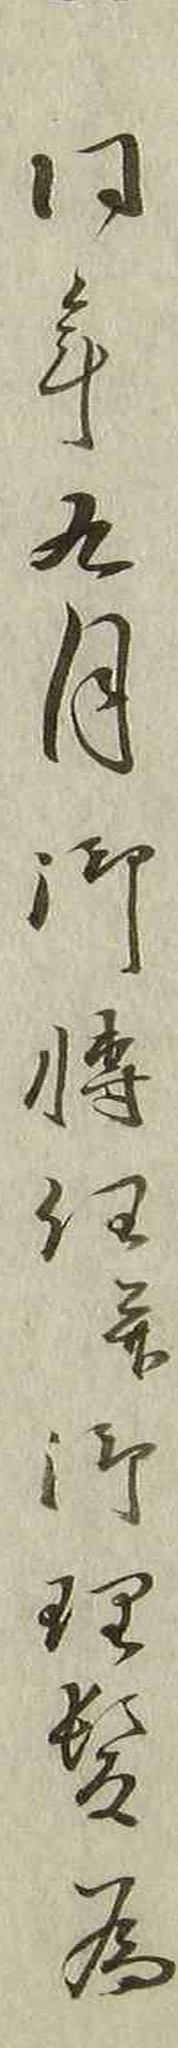一同年九月御転任并御理髪為
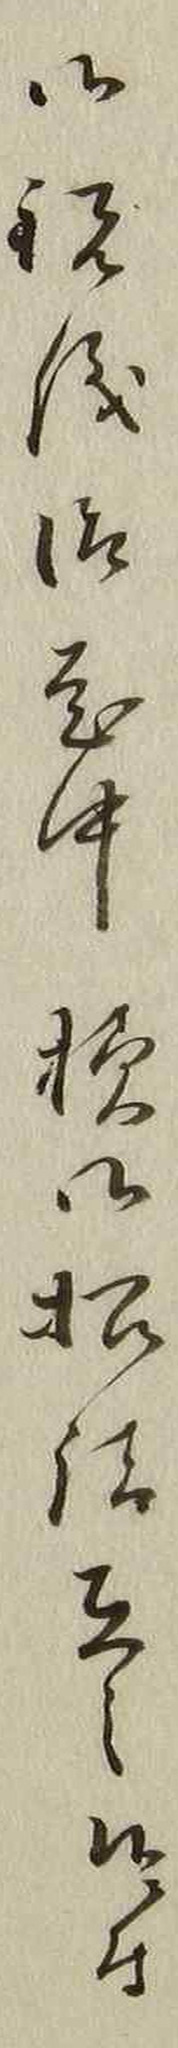御祝儀御老中様御招請在之候ニ付
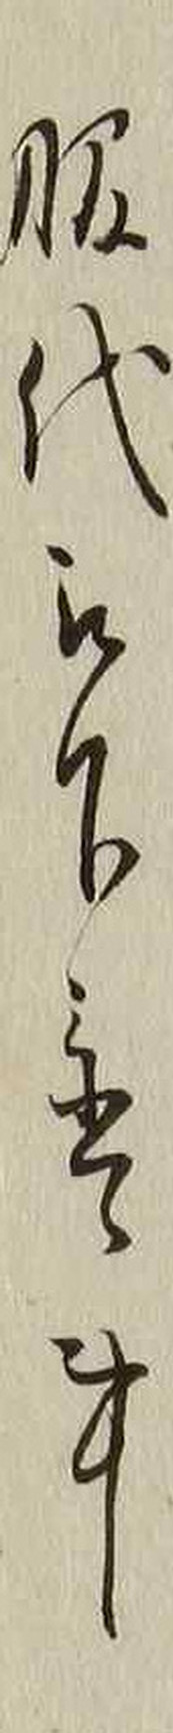服代被下置候事
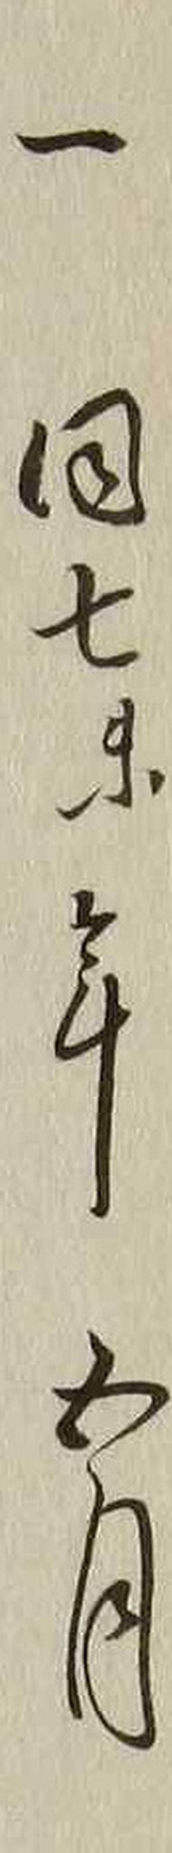一同七未年五月
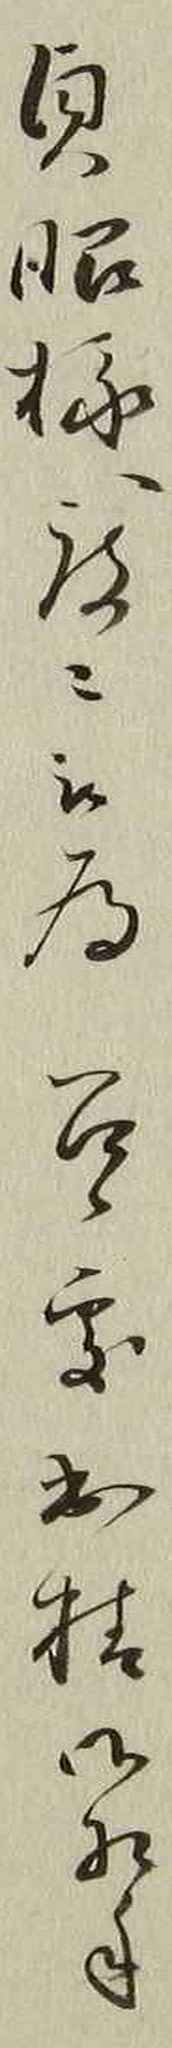貞昭様へ度々被為召候処出精御相手
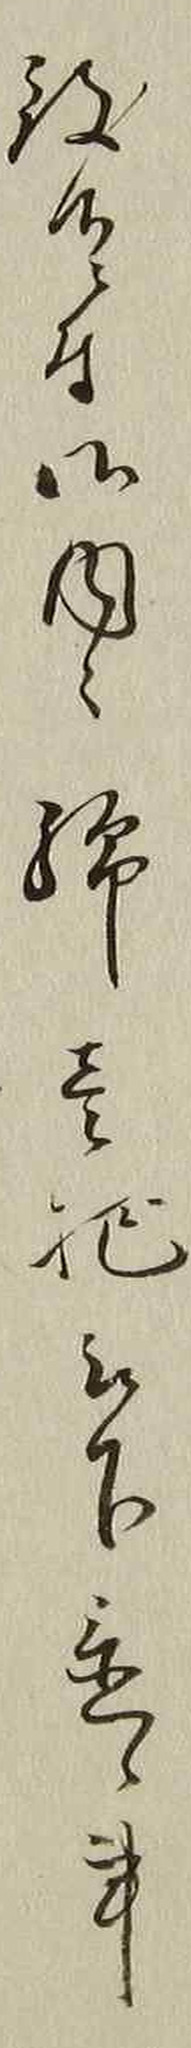致候ニ付御内々綿壱把被下置候事
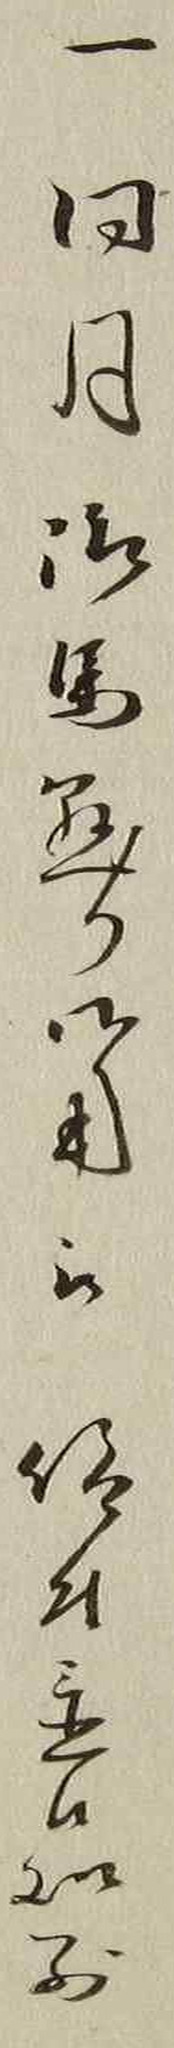一同月御馬懸り御用被仰付置候処別
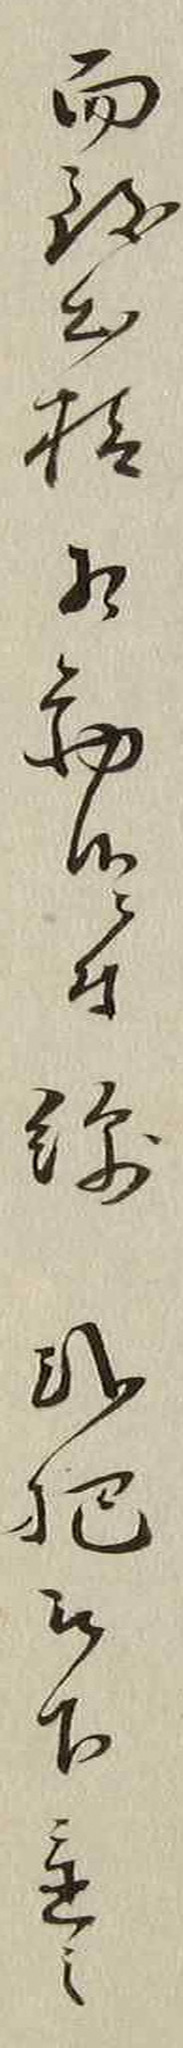而致出精相勤候ニ付綿弐把被下置之
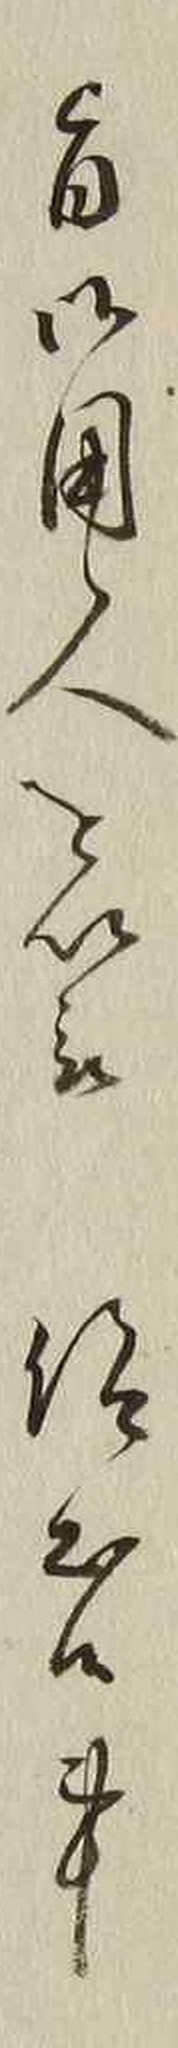旨御用人を以被仰出候事
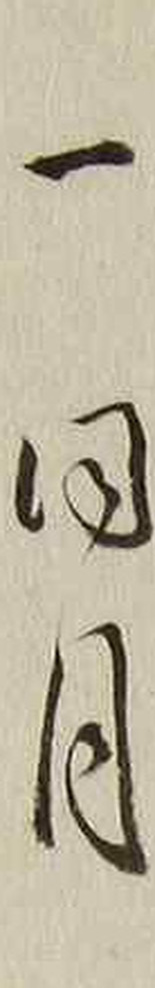一同月
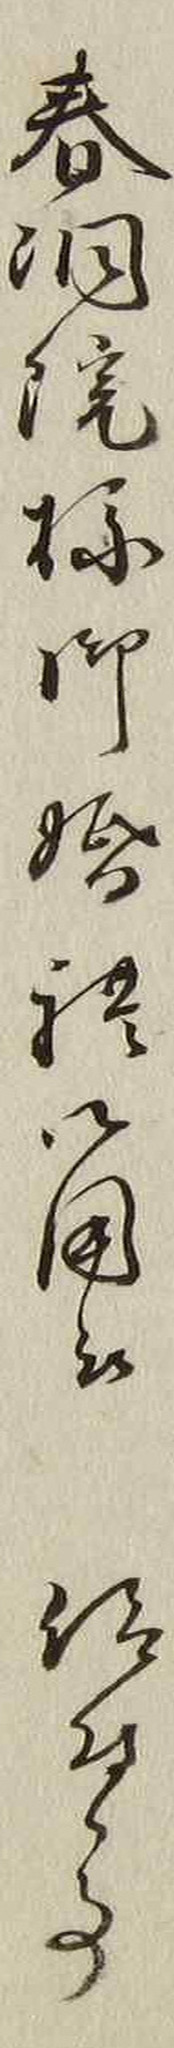春洞院様御婚礼御用被仰付候事
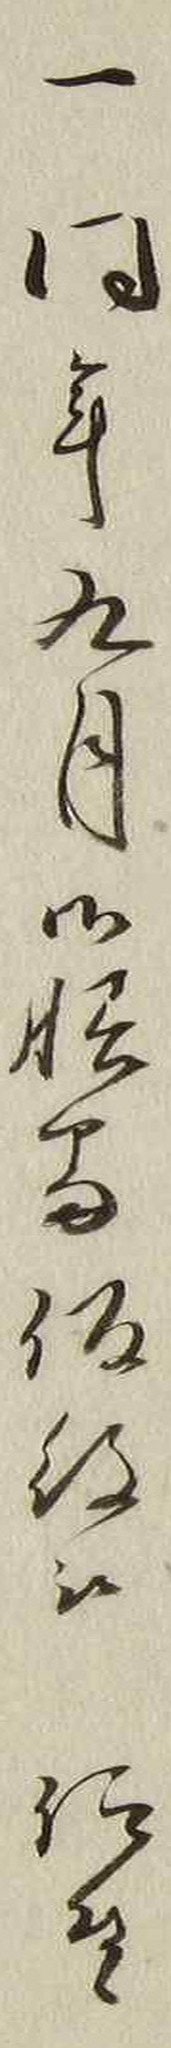一同年九月御膳番仮役被仰付候
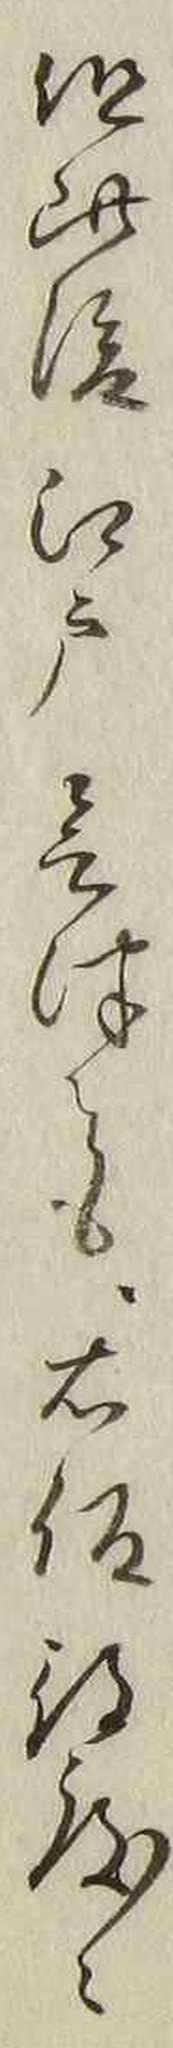但此後江戸会津とも右仮役度々
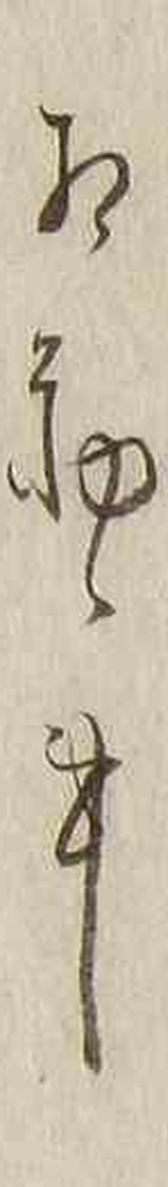相勤候事
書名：諸士系譜　巻之25　い之部25
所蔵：会津若松市立会津図書館
